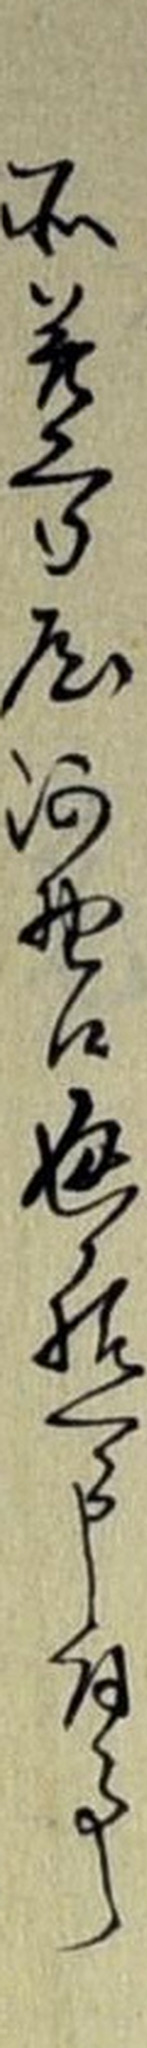所并二ッ屋河野口通候様可申付事
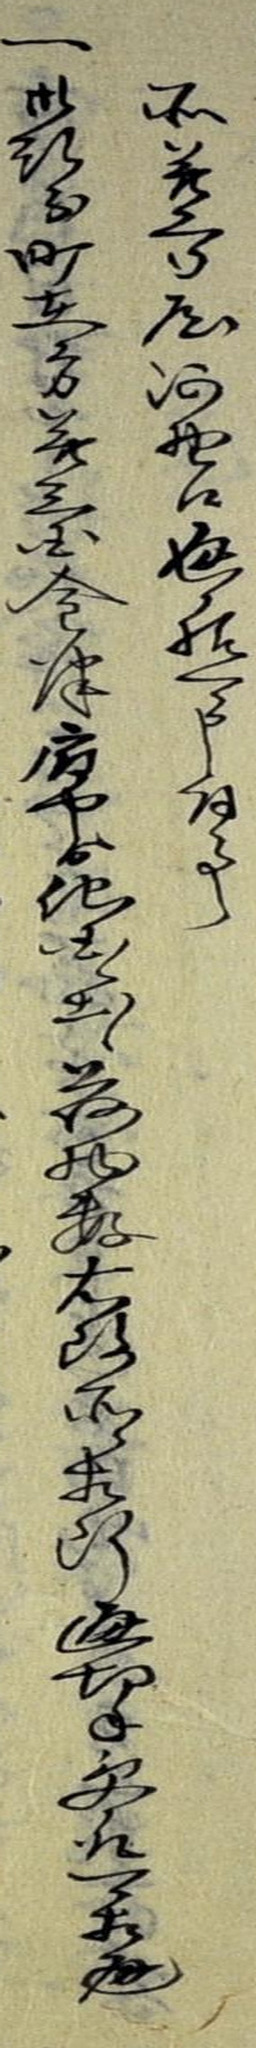一御領分町在方并三国金津府中ゟ他国へ出候荷物数右改所へ相断通切手受取可相通
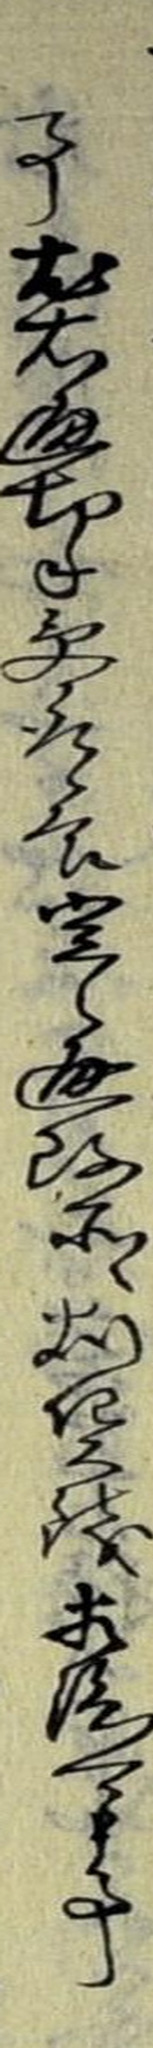事尤右通切手受取候節定之通改所へ判賃銭相渡可申事
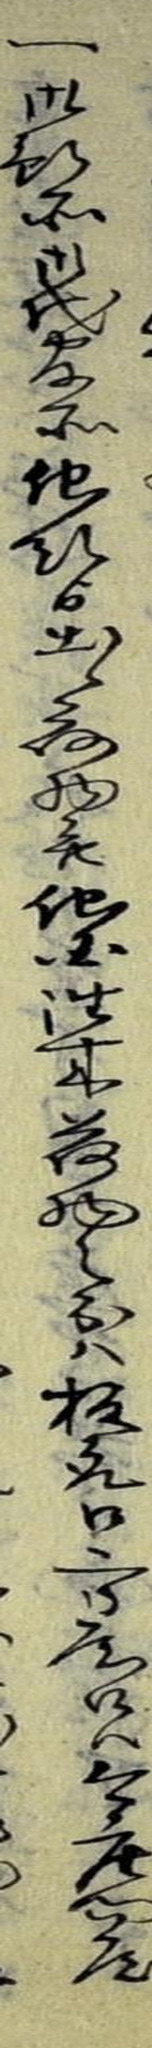一御預所御代官所他領ゟ出候荷物并他国往来荷物之分ハ板取口二ツ屋口ハ今庄問屋
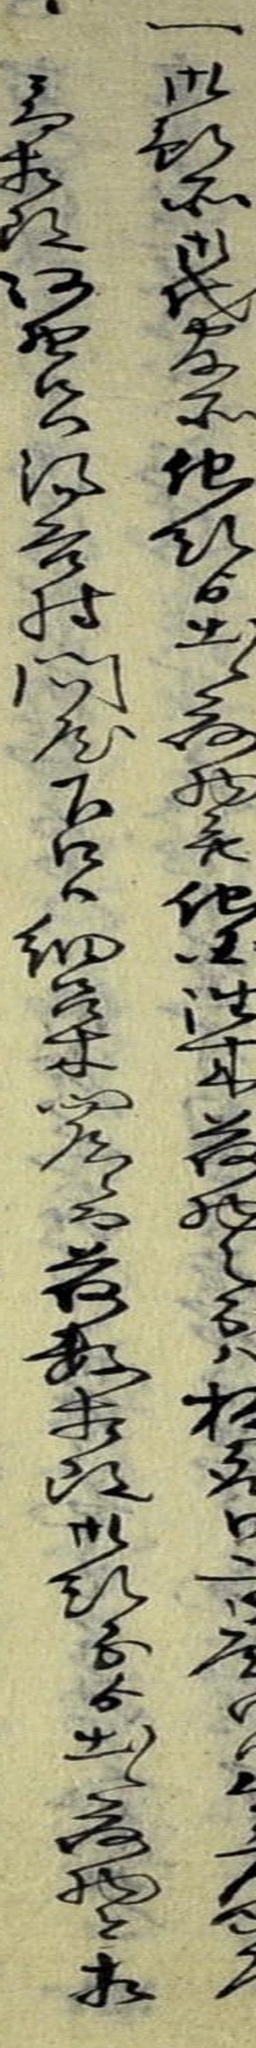ニ而相改河野口ハ湯谷村問屋下口ハ細呂木問屋ニ而荷数相改御領分ゟ出候荷物と相
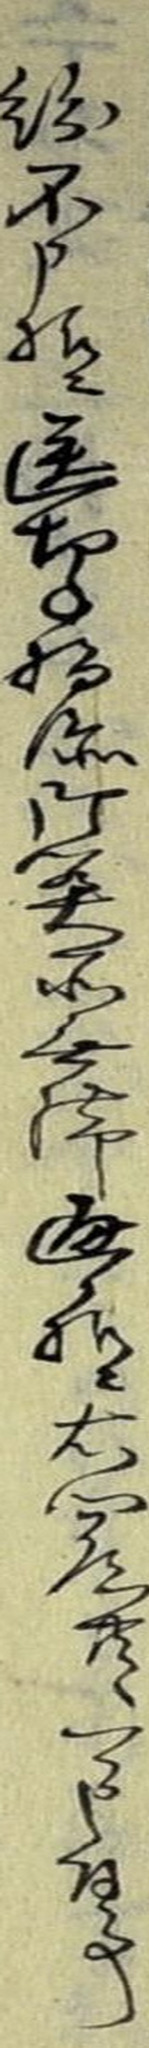紛不申様ニ送切手指添御関所無滞通候様ニ右問屋共へ可被申付事
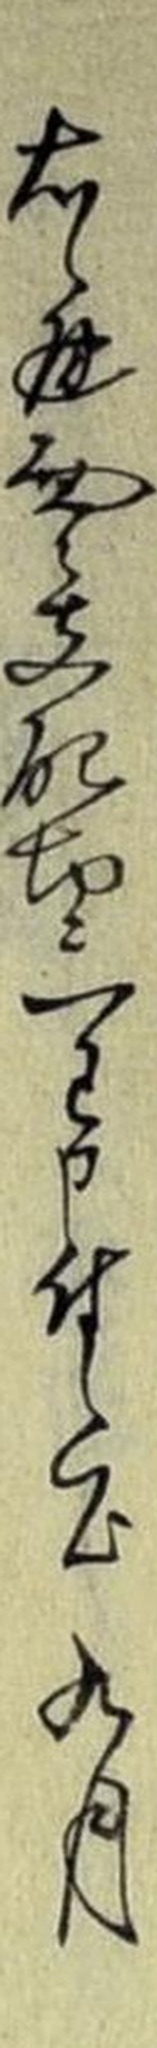右之通面々支配切ニ可被申付候以上九月
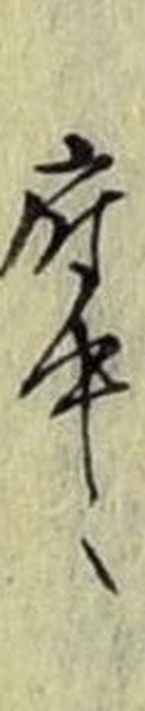府中へ
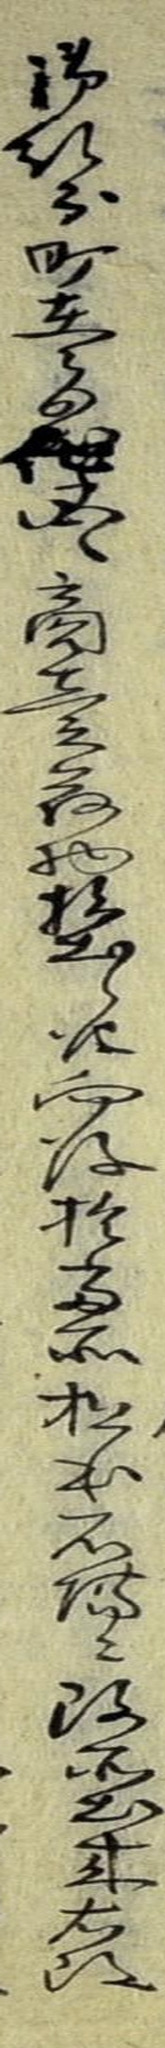御領分町在々ゟ他国へ商売荷物指出候儀向後於当所松本石場ニ改所出来右改
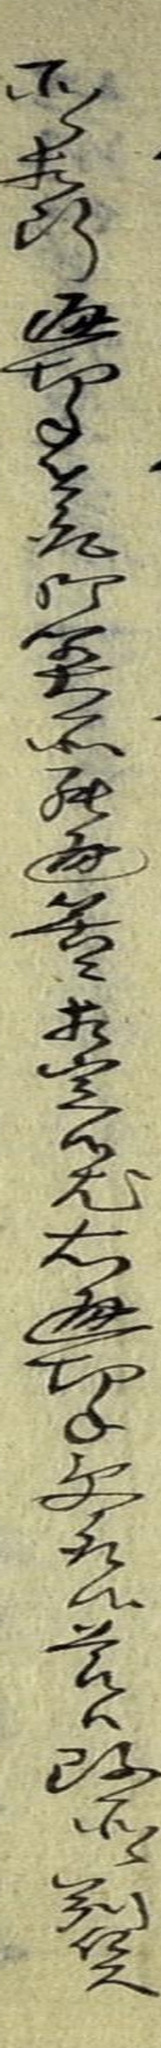所へ相断通切手を取御関所罷通筈ニ相定候尤右通切手受取候節ハ改所へ判賃
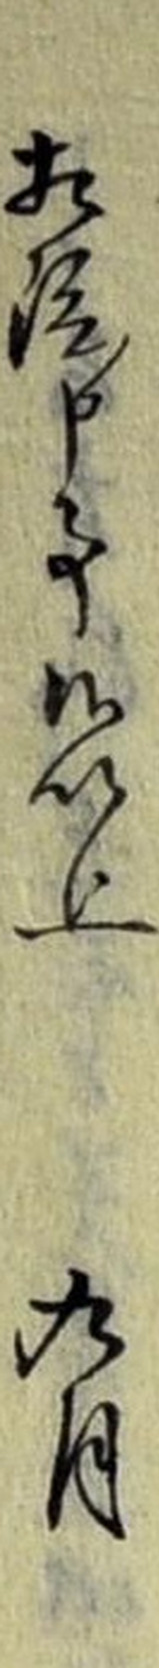相渡申事候以上九月
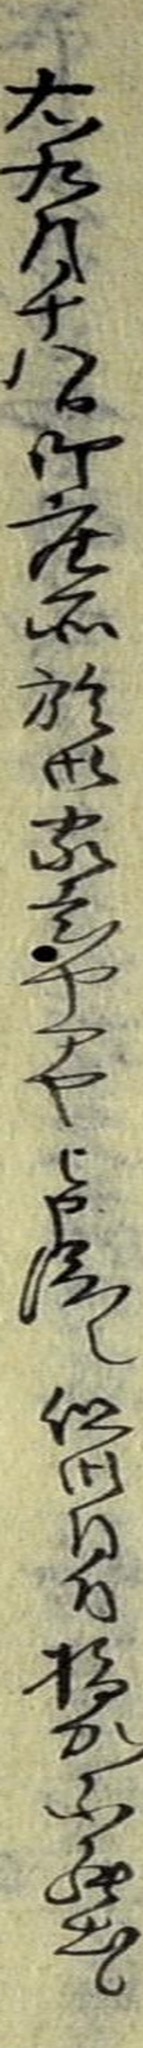右九月十八日御座所於御家老中部屋被申渡候但御目付指加不罷出候
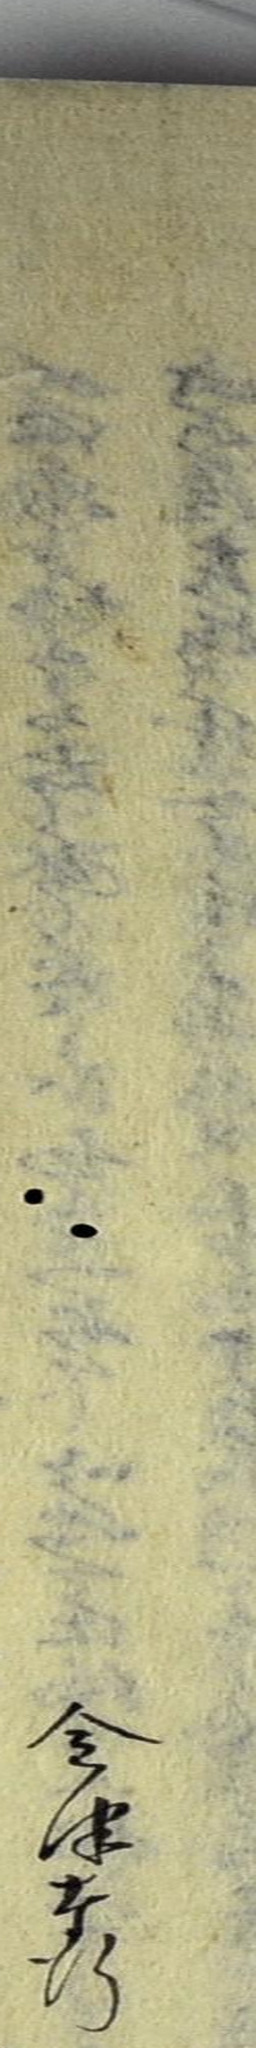金津奉行
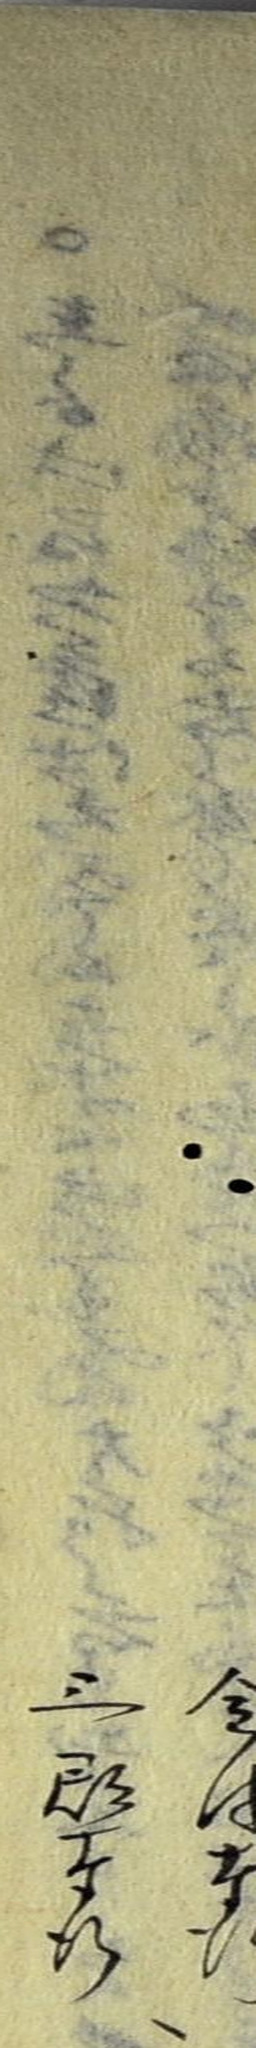三郡奉行へ

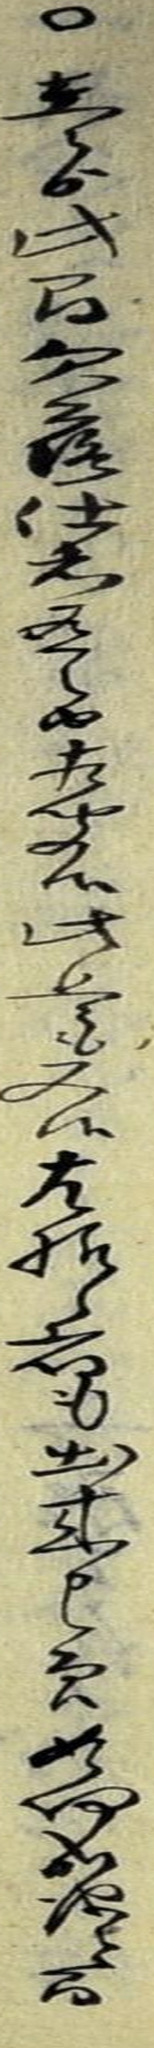〇在々ゟ此間欠落仕者有之由相聞候此上ニも又候左様之者も出来申候而ハ如何成儀ニ候間
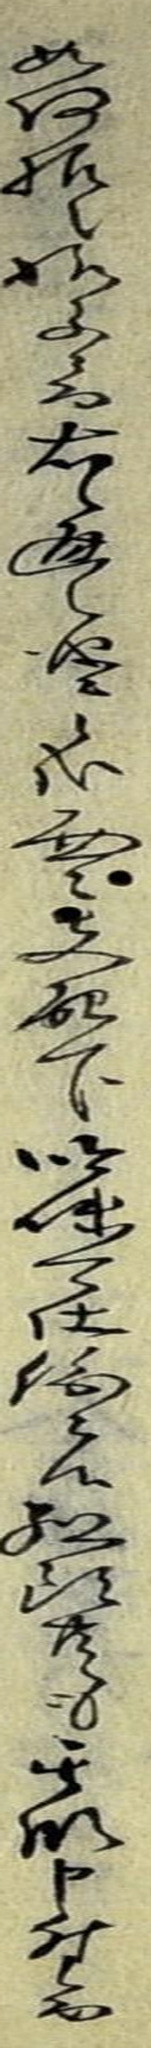如何様之様子ニ而右之通之儀ニ候哉面々支配下吟味可仕儀ニ候組頭共へも其段申付候而
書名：命令之部 一
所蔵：福井県文書館 Fukui Prefectural Archives
